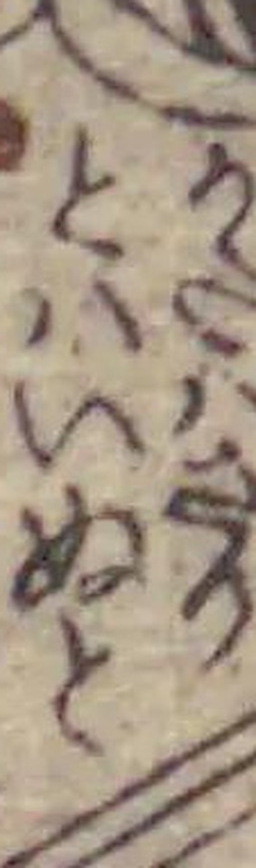とはいぬと
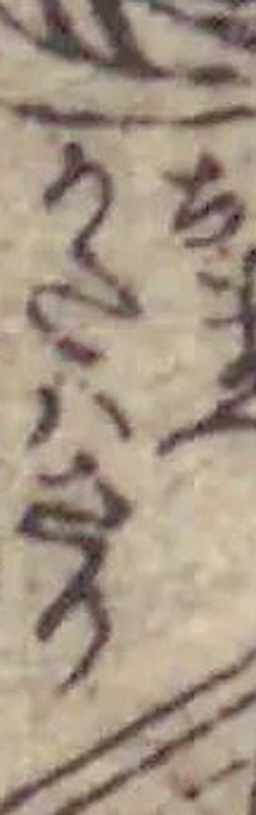かたはさり
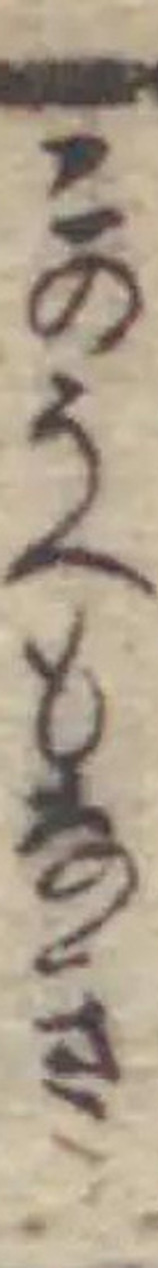このうへもなき
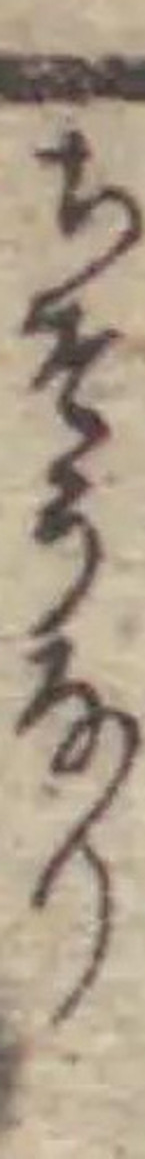ちそうなり
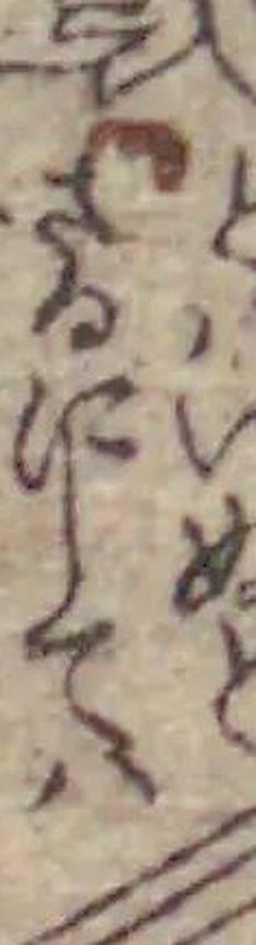さるにしては
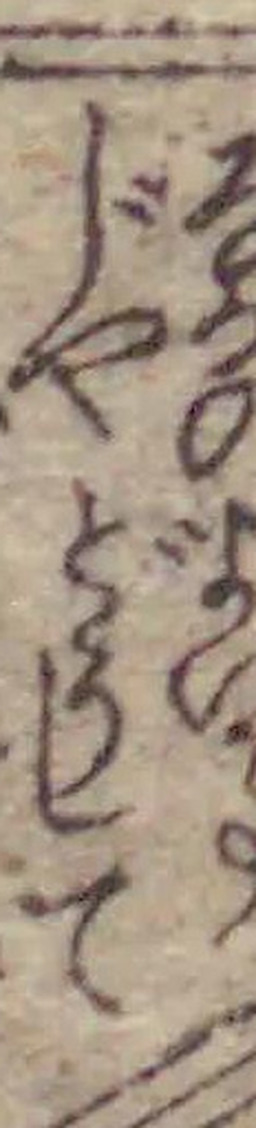じやどうして
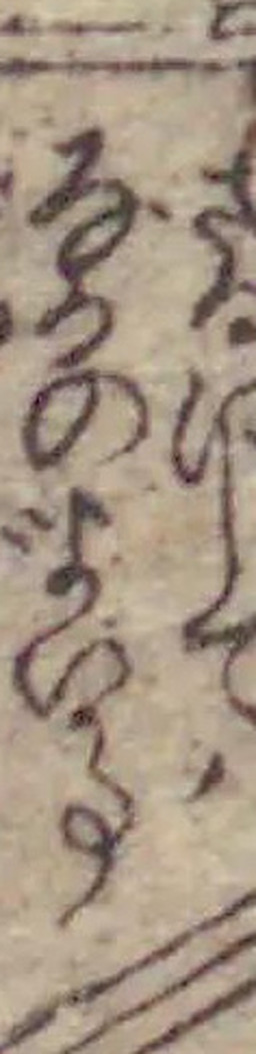なかのよい事
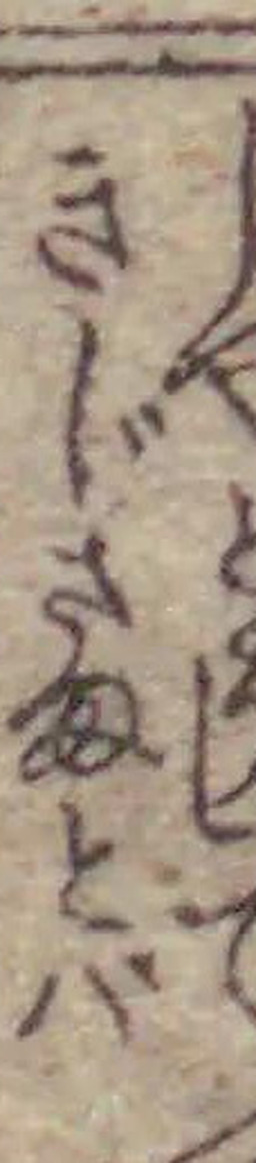きじさまとは
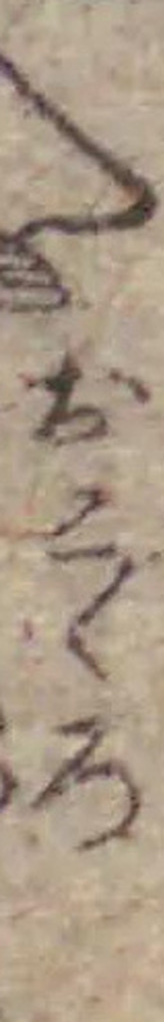おこゝろ
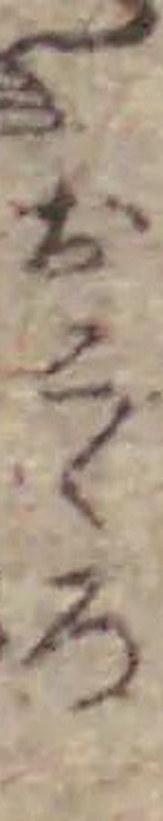おこゝろ
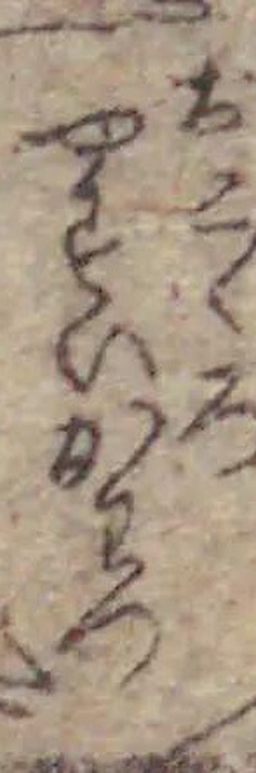やすいかわつた
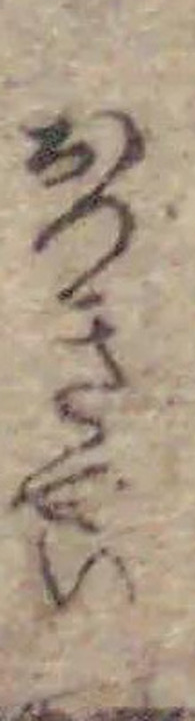おつきせい

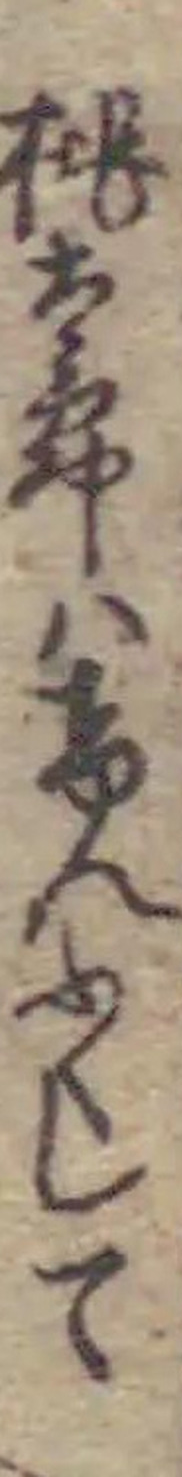桃太郎申はけんふくして
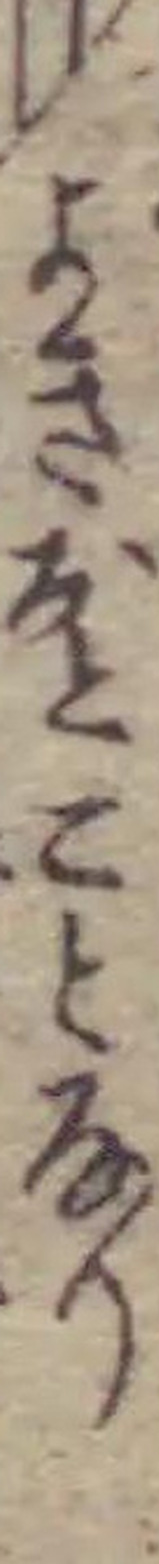よきおとことなり
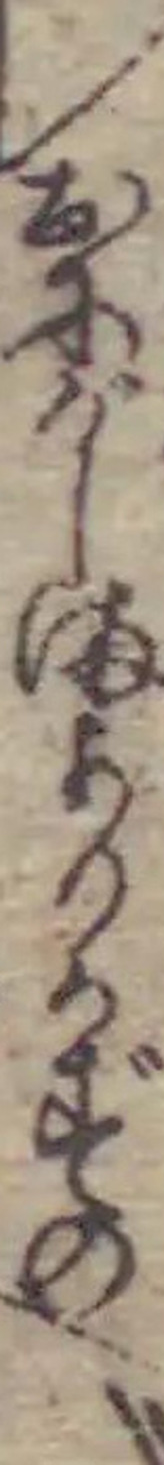おにがしまよりかずの
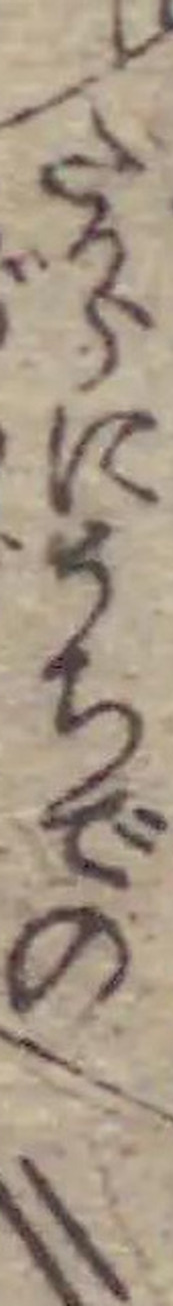たからにうちでの
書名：桃太郎元服姿 2巻
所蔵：国立国会図書館 National Diet Library, JAPAN
